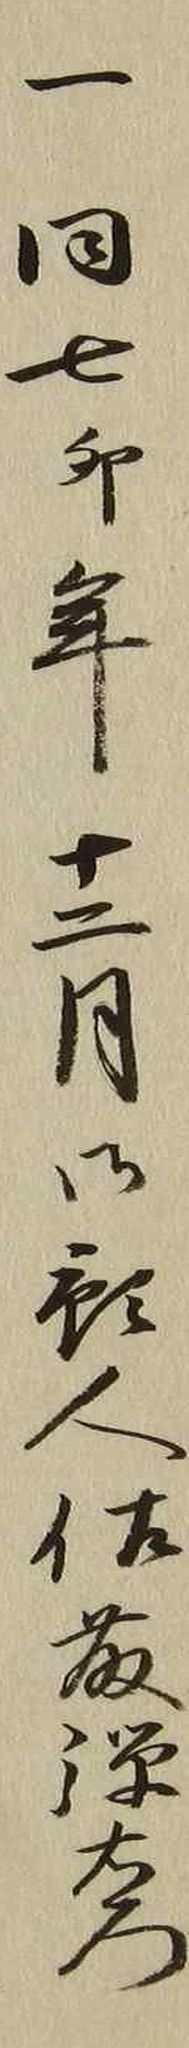一同七卯年十二月御預人佐藤弾右衛門
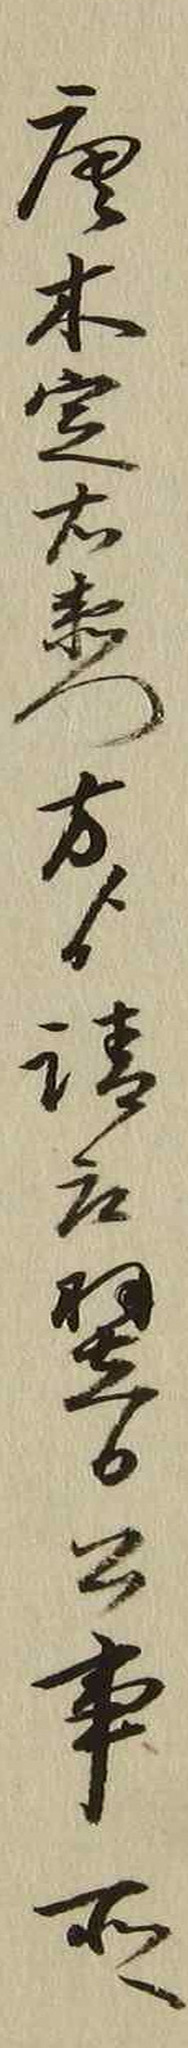唐木定右衛門方ゟ請取翌日公事所へ
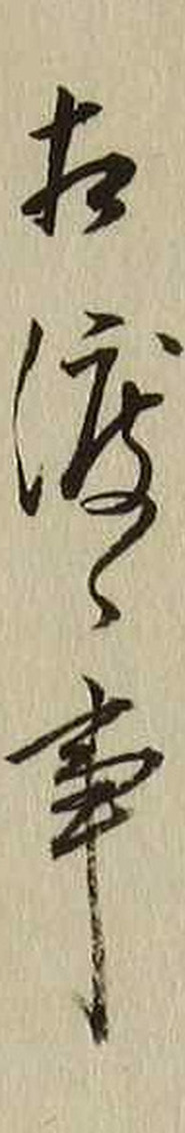相渡候事
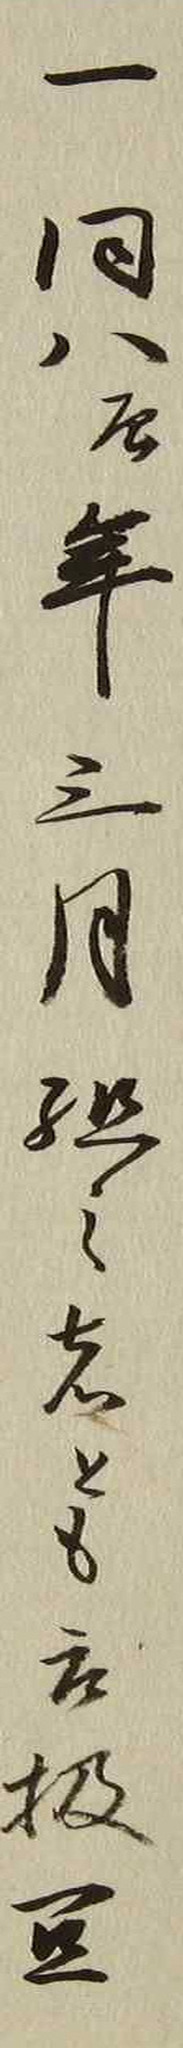一同八辰年三月組之者とも取扱宜
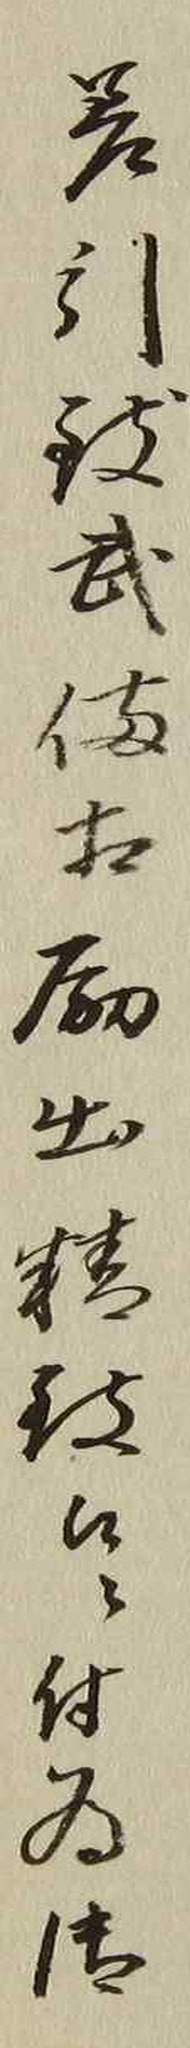差引致武備相励出精致候ニ付為御
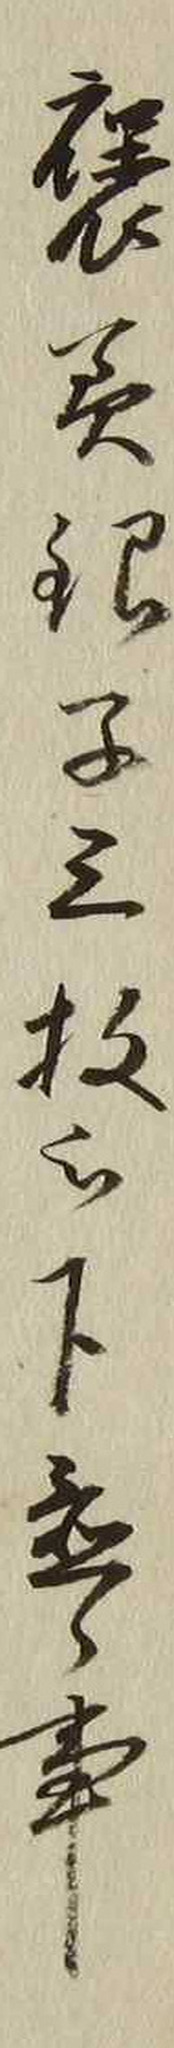褒美銀子三枚被下置候事
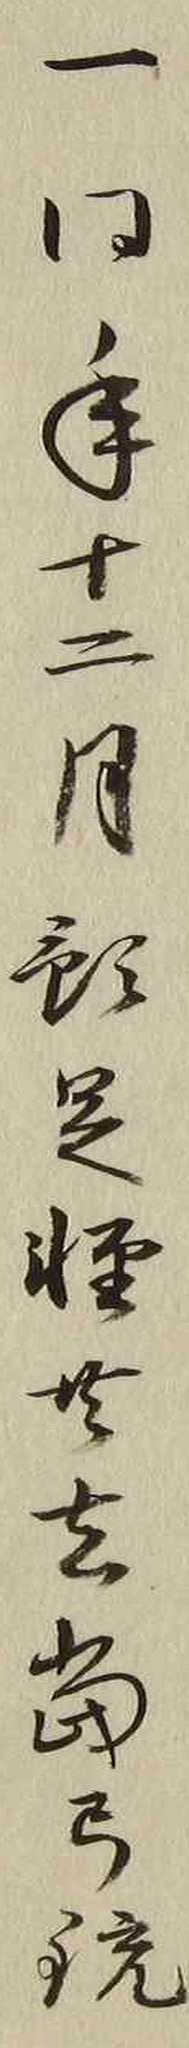一同年十二月預足軽共去当弓銃
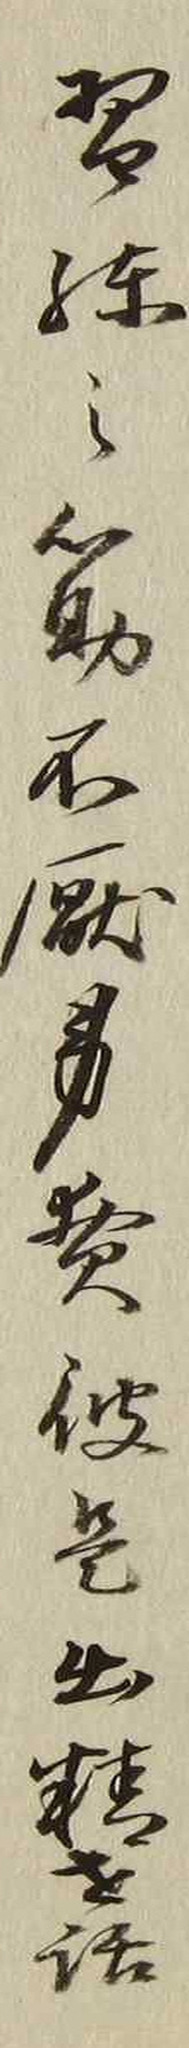習陣之筋不厭労費彼是出精世話
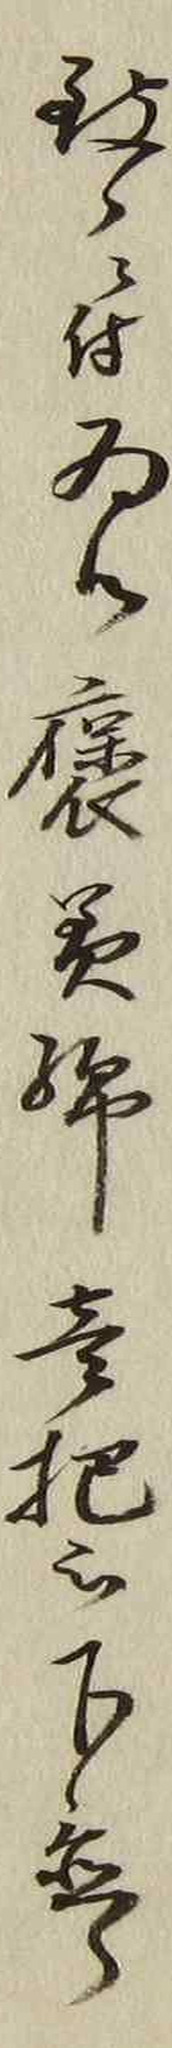致候ニ付為御褒美綿壱把被下置候
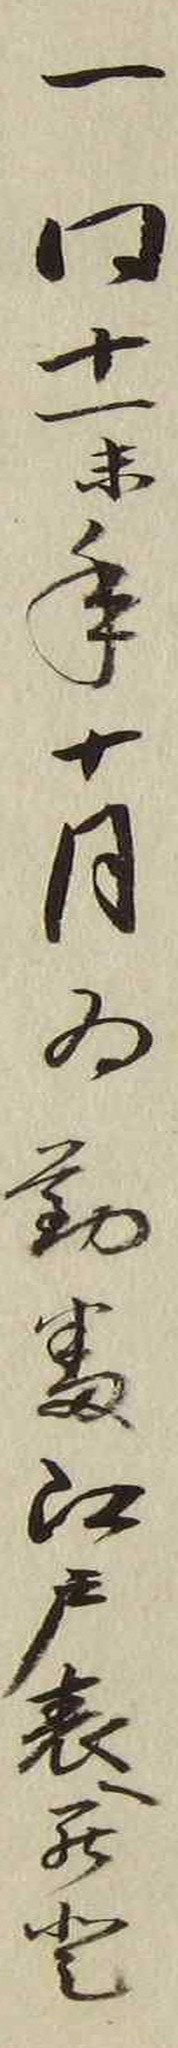一同十一未年十月為勤番江戸表へ罷登
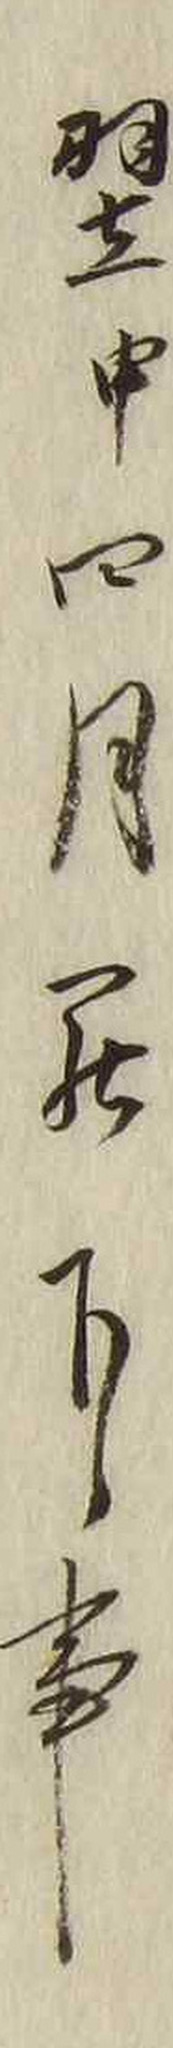翌申四月罷下候事
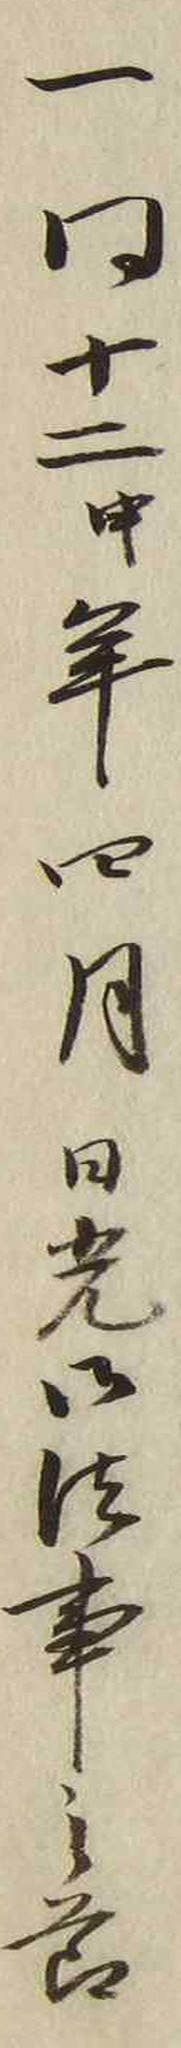一同十二申年四月日光御法事之節

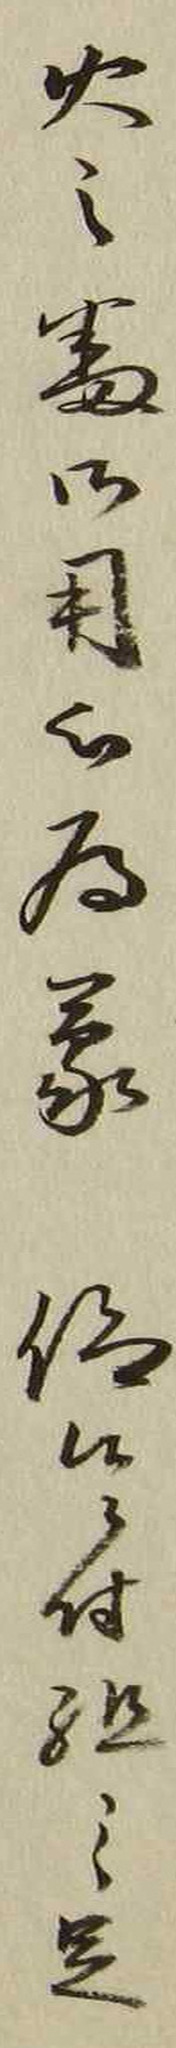火之番御用被為蒙仰候ニ付組之足
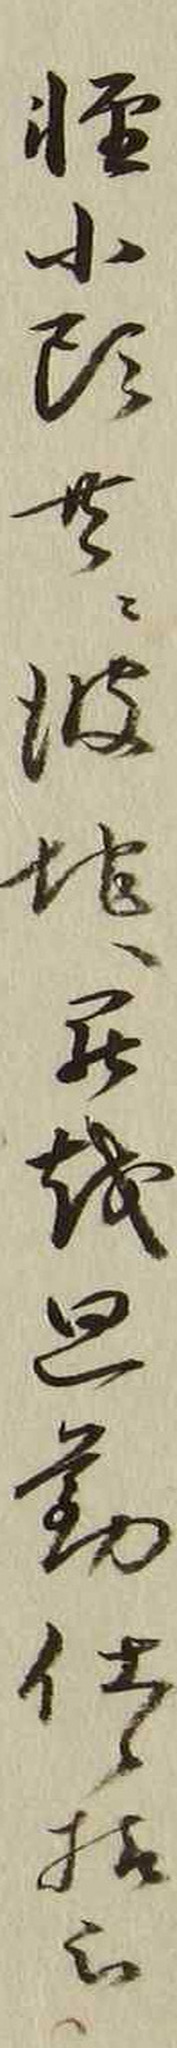軽小頭共ニ彼地へ罷越廻勤仕候様被
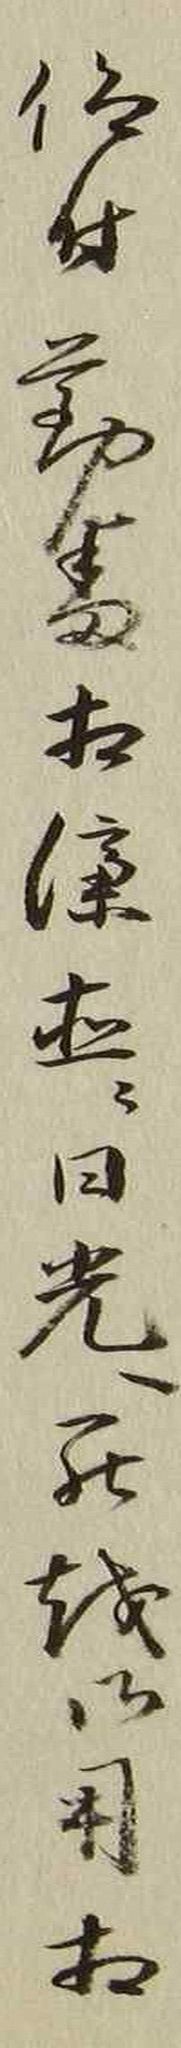仰付勤番相済直ニ日光へ罷越御用相
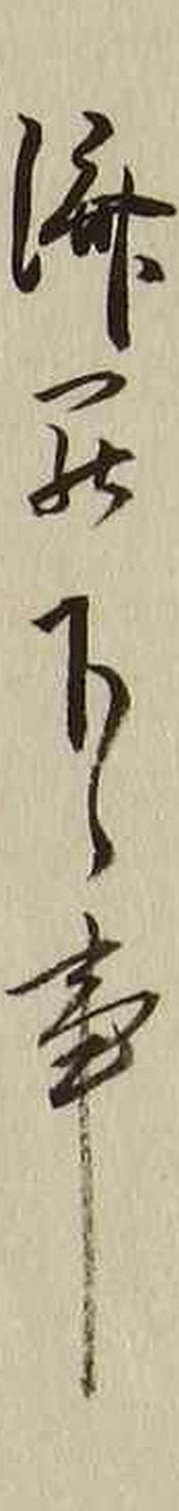済罷下候事
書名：諸士系譜　巻之69　を之部3
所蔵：会津若松市立会津図書館
